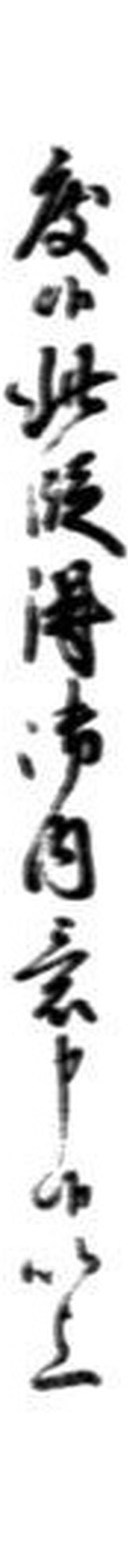土候此段得御内意申候以上
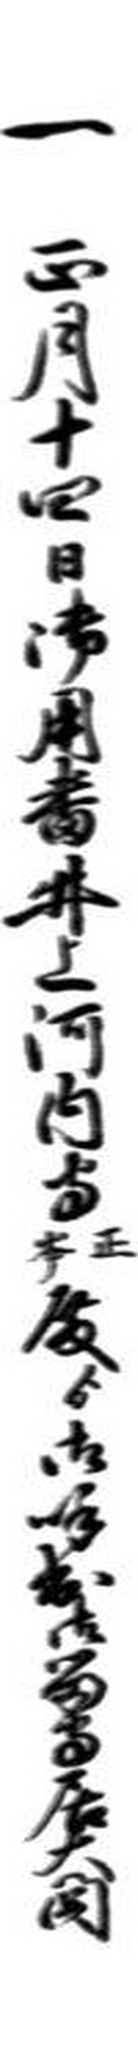一正月十四日御用番井上河内守正岑殿ゟ御呼出御留守居大関

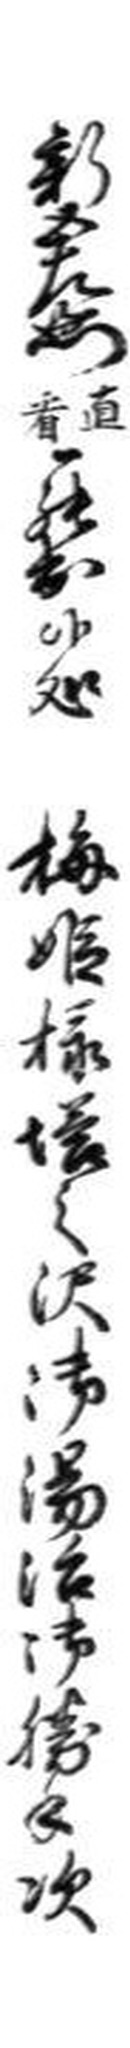新五左衛門直看罷出候処梅姫様塔之沢御湯治御勝手次
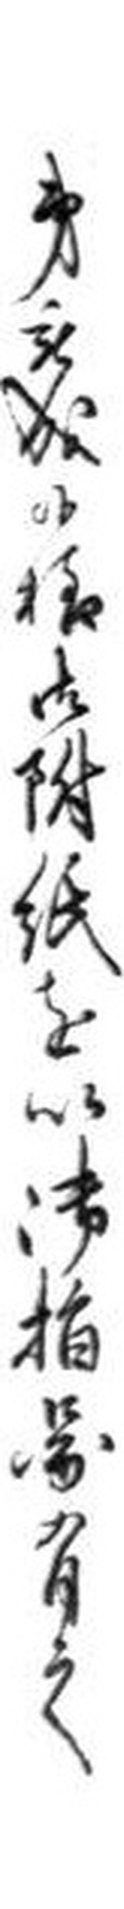第被成候様御附紙を以御指図有之
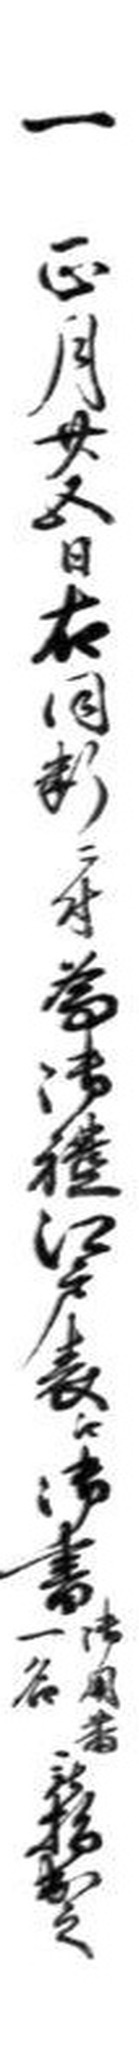一正月廿五日右同断ニ付為御礼江戸表江御書御用番一名被指出之
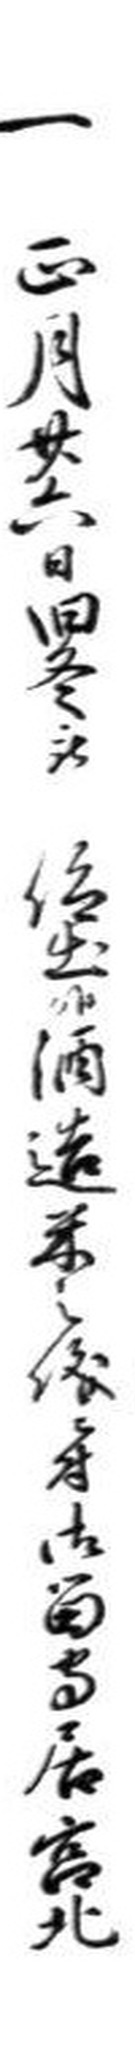一正月廿六日旧冬被仰出候酒造米之儀ニ付御留守居宮北
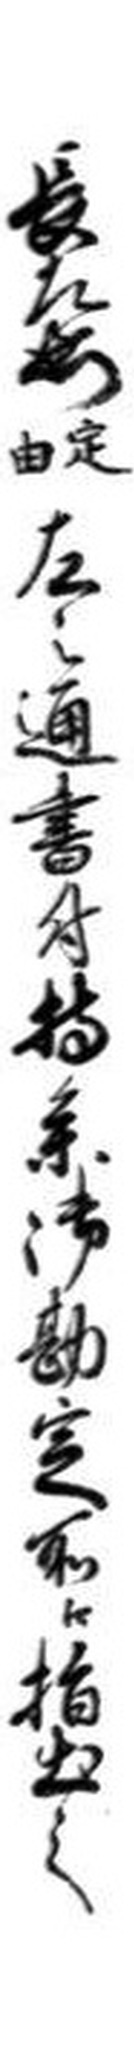長左衛門定由左之通書付持参御勘定所江指出之
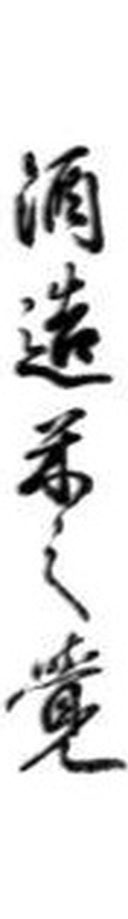酒造米之覚
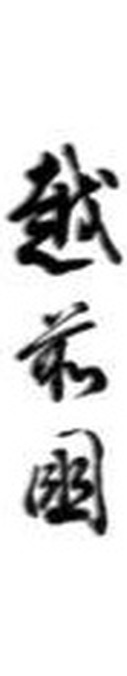越前国
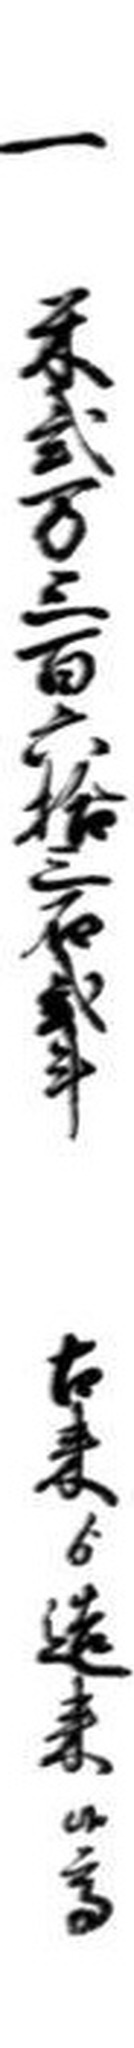一米弐万三百六拾三石弐斗古米ゟ造来候高
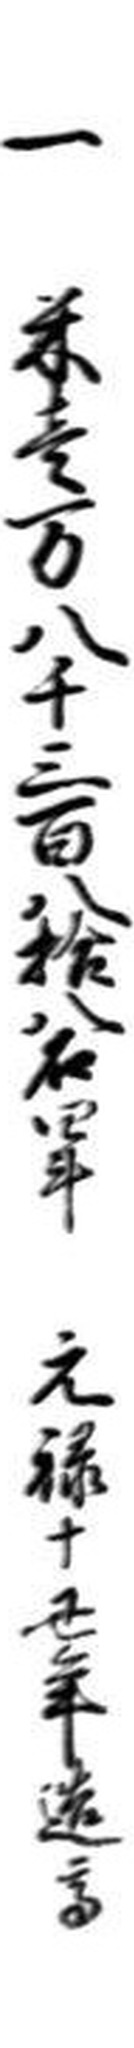一米壱万八千三百八拾八石四斗元禄十丑年造高
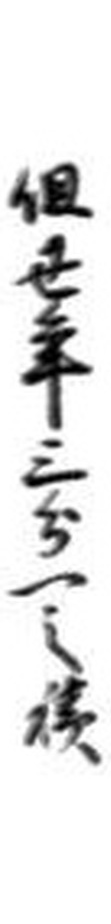但丑年三分一積
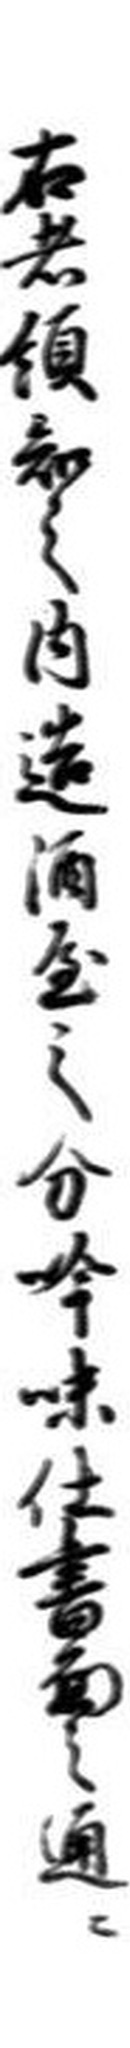右者領知之内造酒屋之分吟味仕書面之通ニ
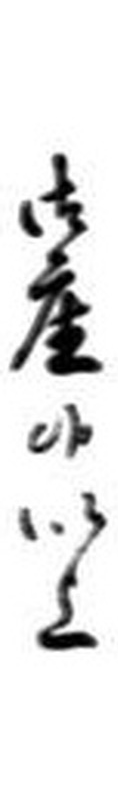御座候以上
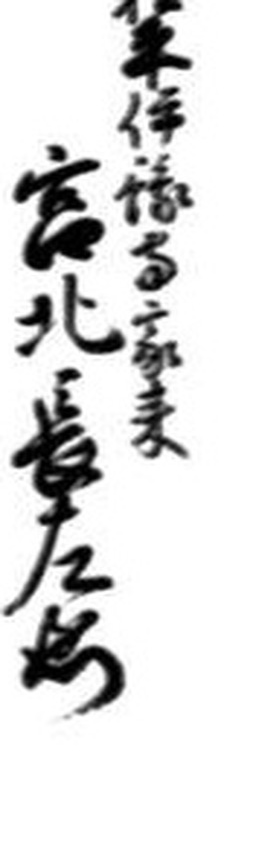宮北長左衛門
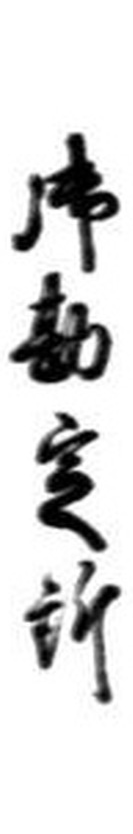御勘定所
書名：家譜 三十一 吉邦公 享保元年
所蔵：福井県文書館 Fukui Prefectural Archives
